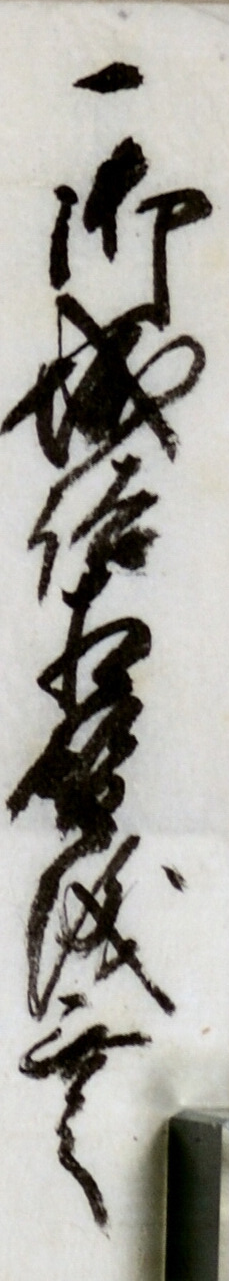一御城詰相替儀無之
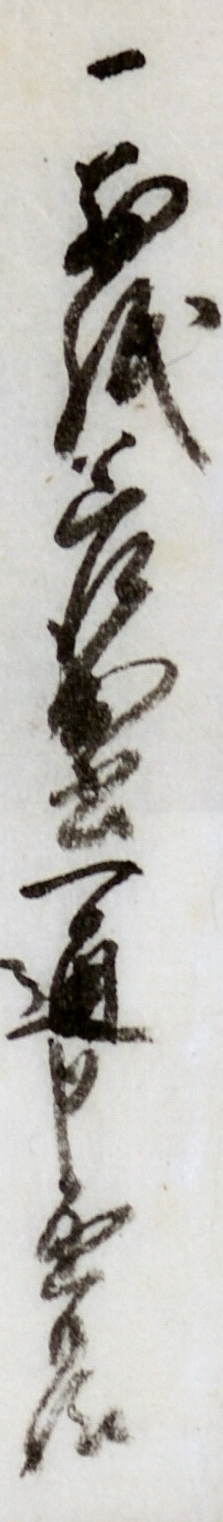一別紙差出一通申通候様
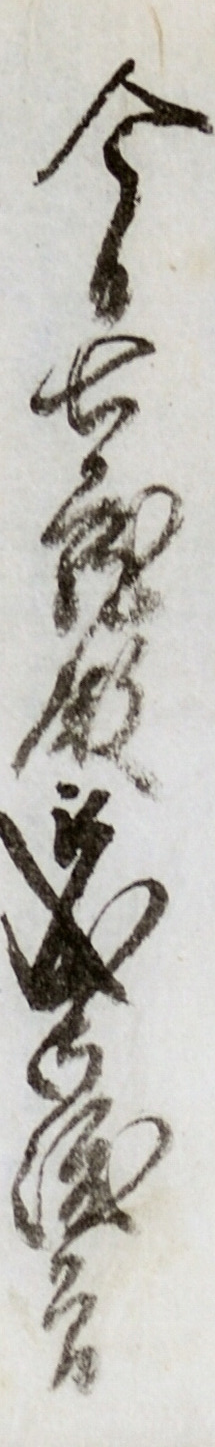今日七蔵殿被成御渡候間
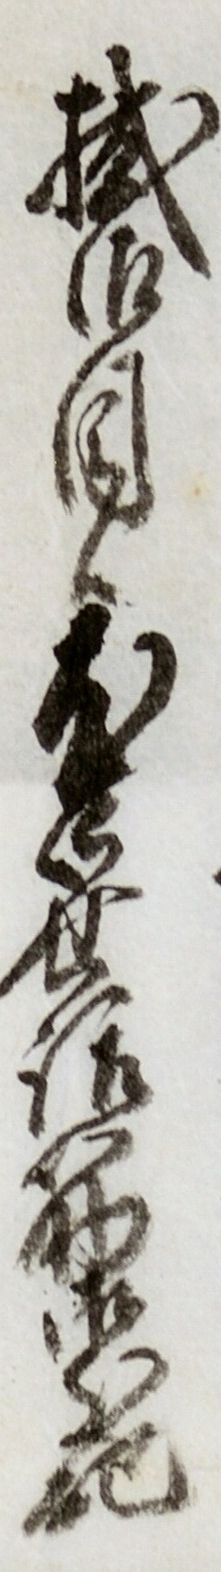掛御目候尤御世話筋御支配
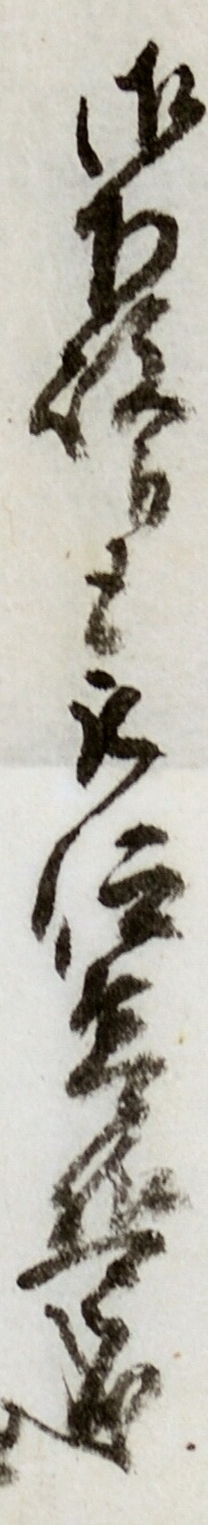御下役えも被仰置候様可被成
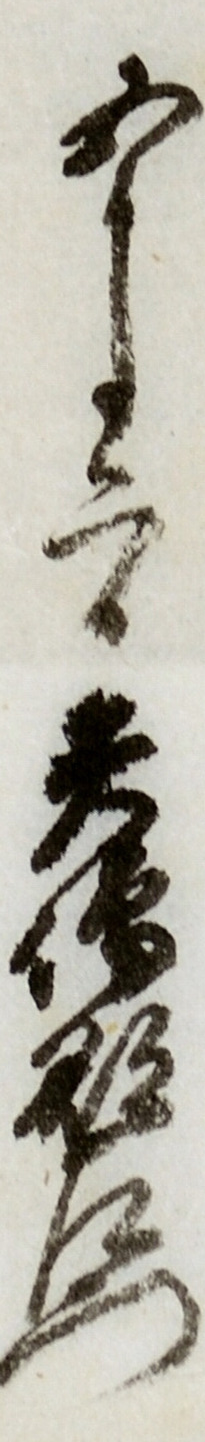五月二日矢嶋郡左衛門
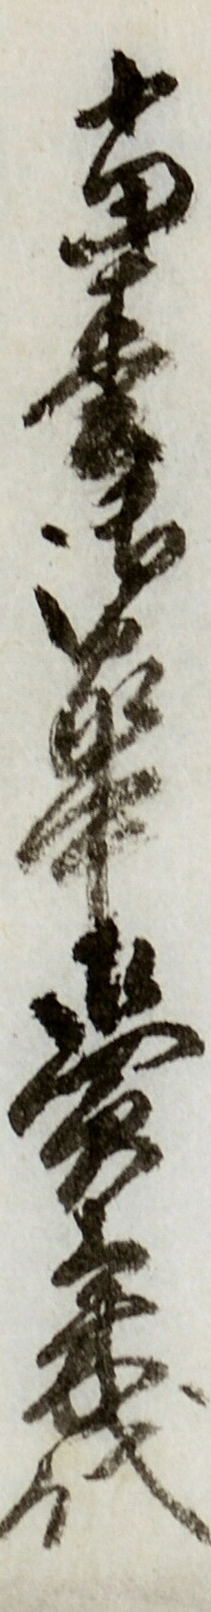当春御家中御買上米代
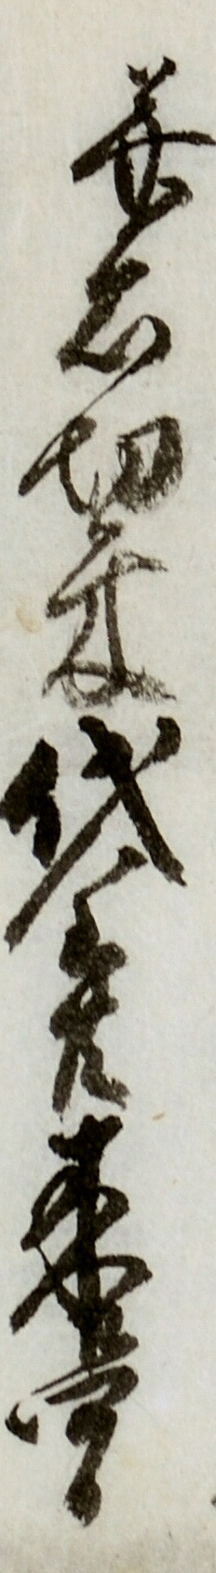并右切米代金共来る四日
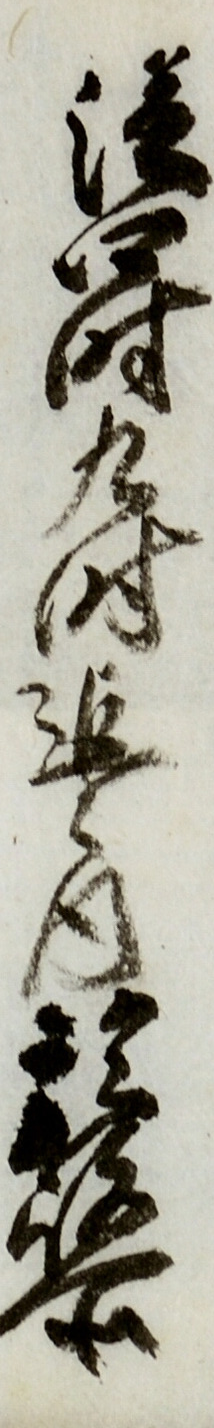従四時九時迄之内於役所
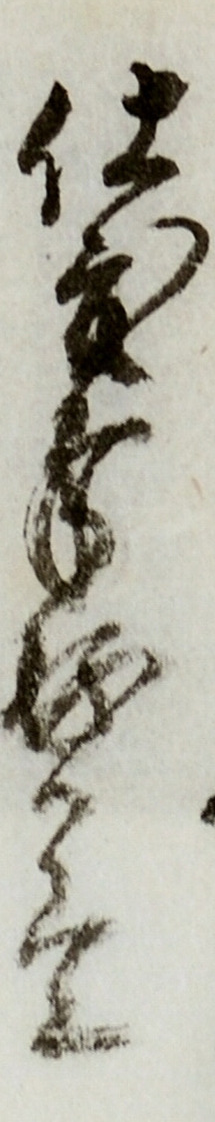仕度奉存候以上
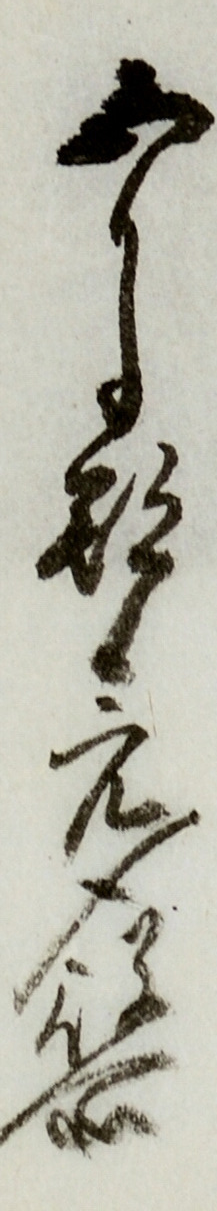五月朔日元〆役所
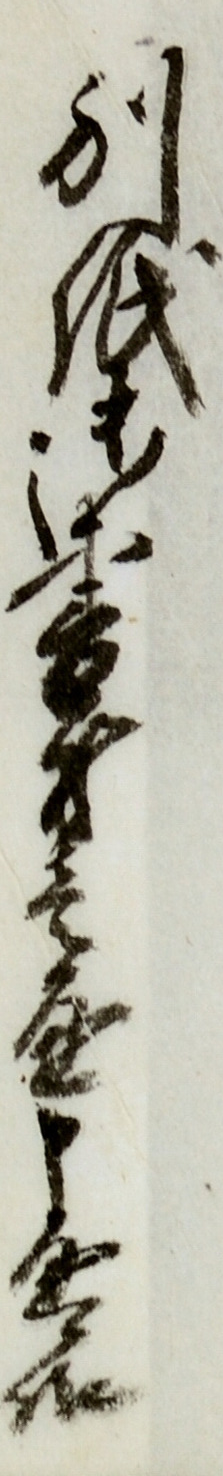別紙御書付壱通申通候様
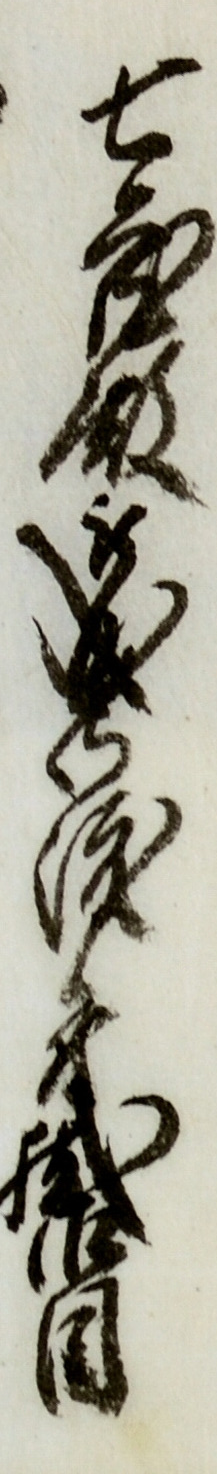七蔵殿被成御渡候付掛御目
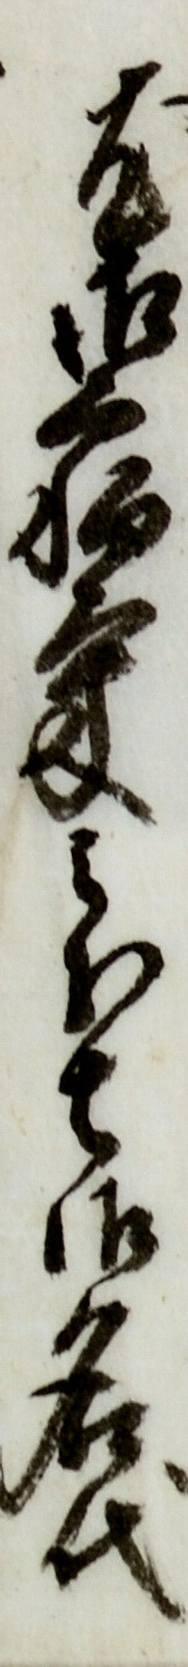尤御病気之分は御名代
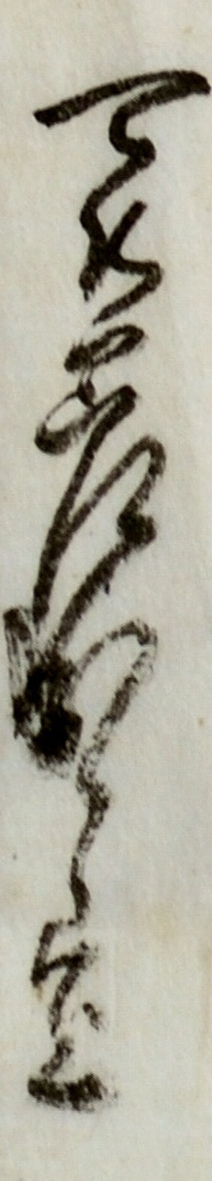可被差出候以上

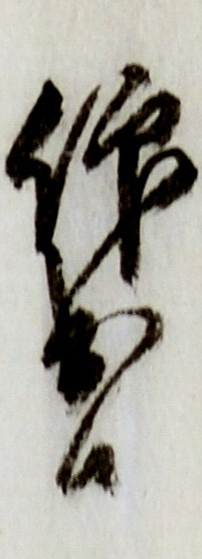仰出候
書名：諸事御用留帳
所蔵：伊那市立高遠町図書館・合同会社AMANE
